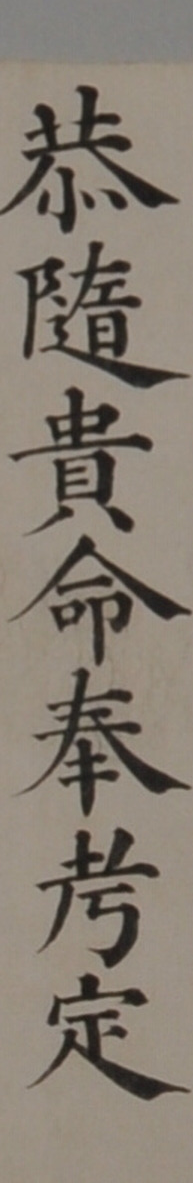恭随貴命奉考定
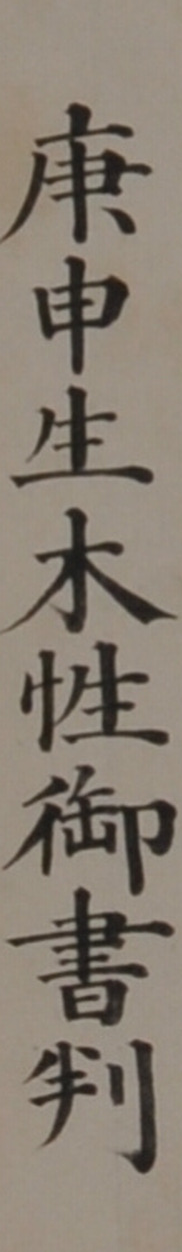庚申生木性御書判
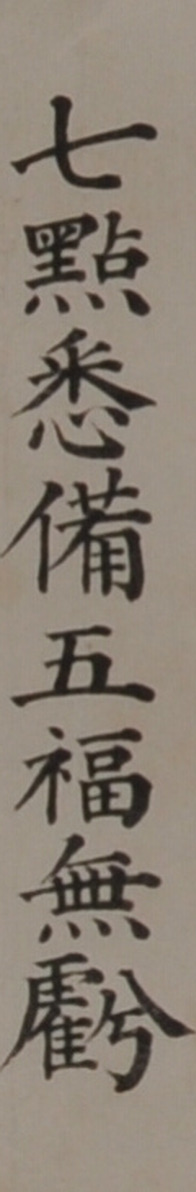七点悉備五福無虧
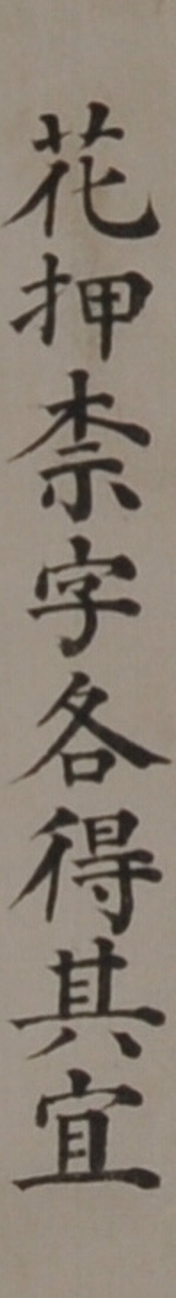花押柰字各得其宜
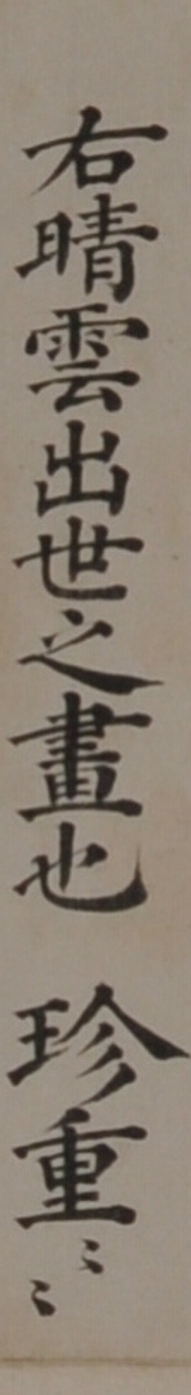右晴雲出世之画也珍重〃〃
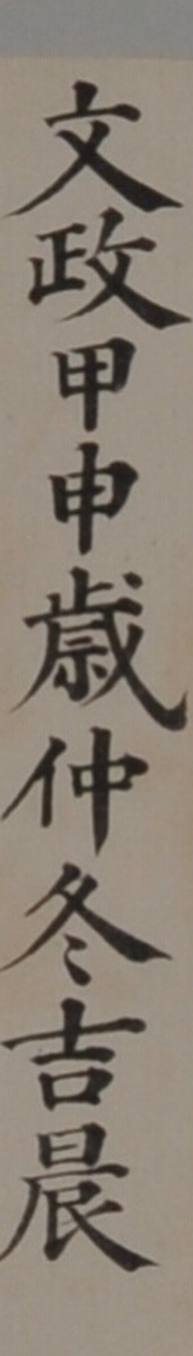文政甲申歳仲冬吉辰
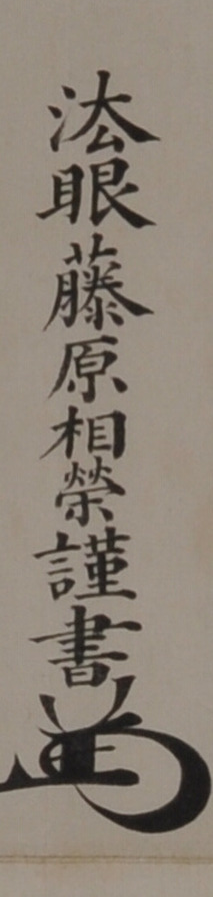法眼藤原相栄謹書
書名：木性御花押
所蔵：伊那市立高遠町図書館・合同会社AMANE
